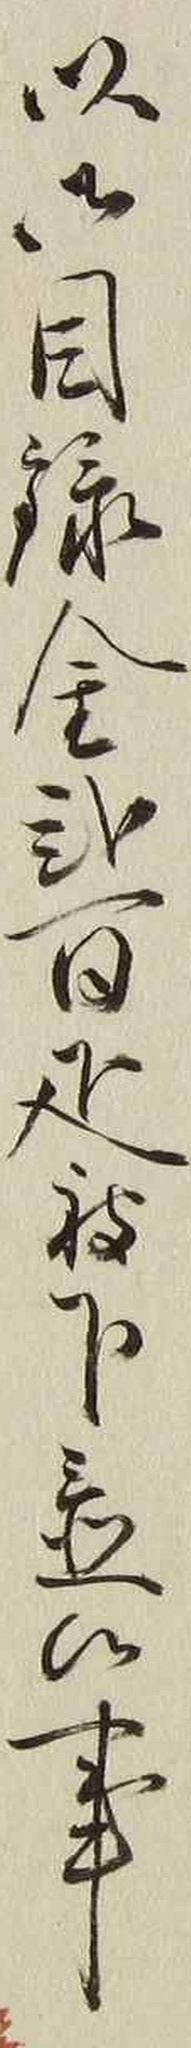以御目録金弐百疋被下置候事
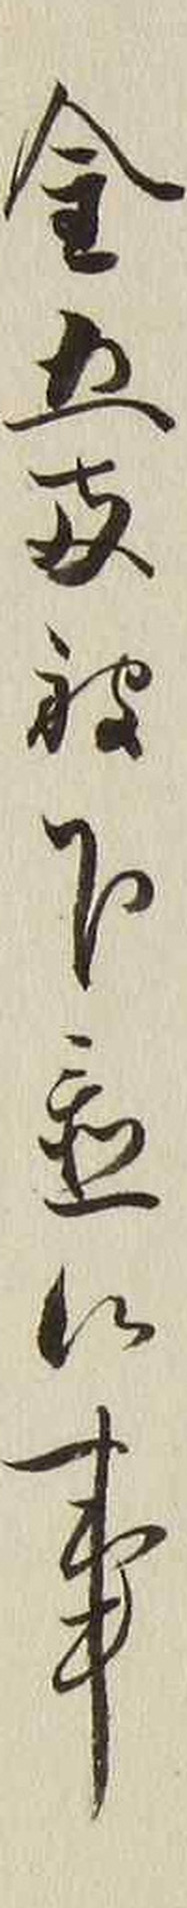金五両被下置候事
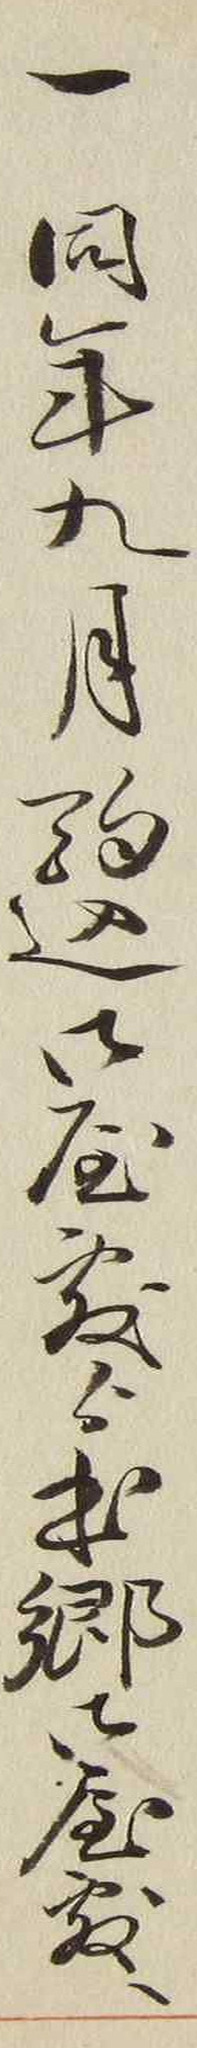一同年九月駒込御屋敷ゟ本郷御屋敷ㇸ
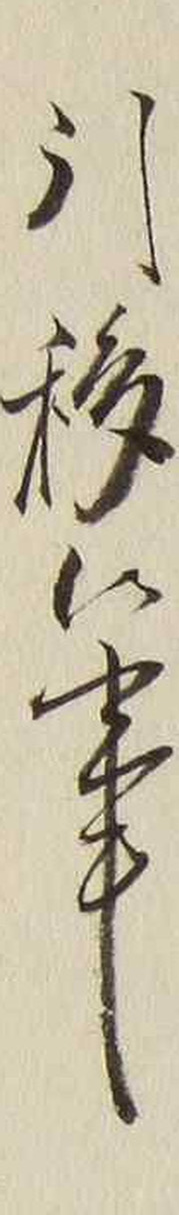引移候事

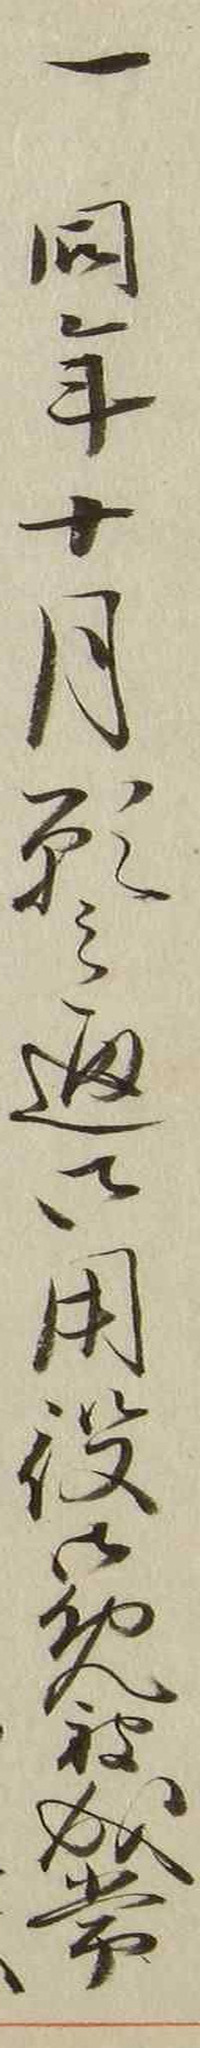一同年十月願之通御用役御免被成常
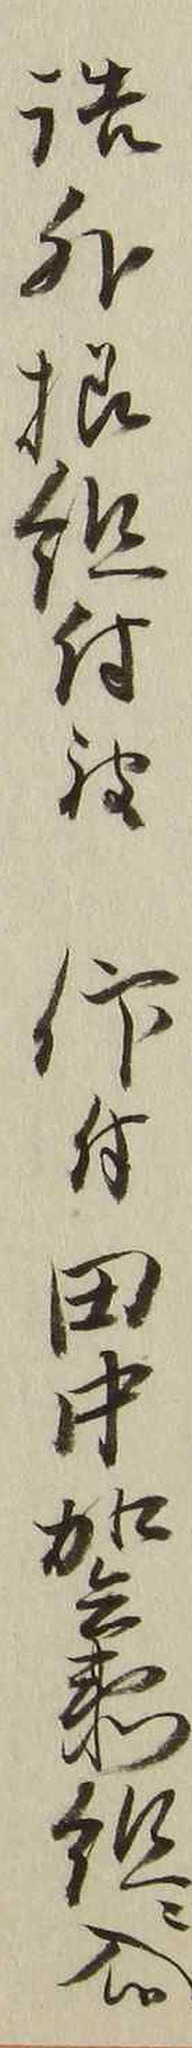詰外様組付被仰付田中嘉兵衛組ニ入候
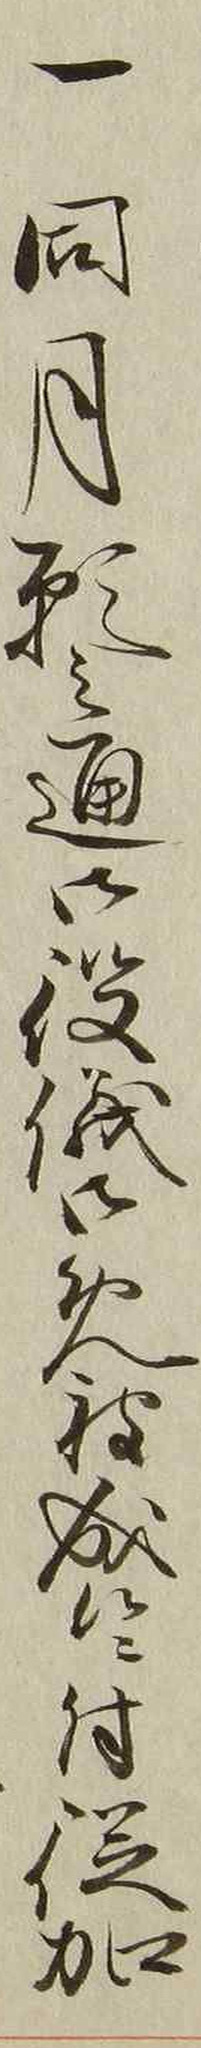一同月願之通御役儀御免被成候ニ付従加
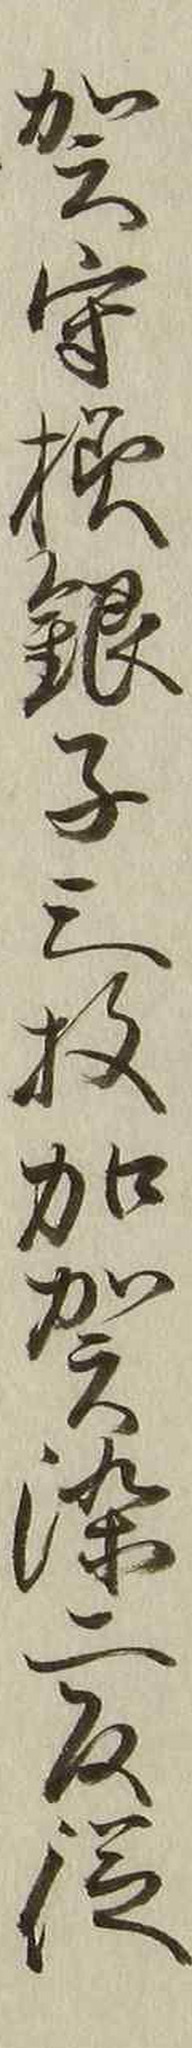賀守様銀子三枚加賀染二反従
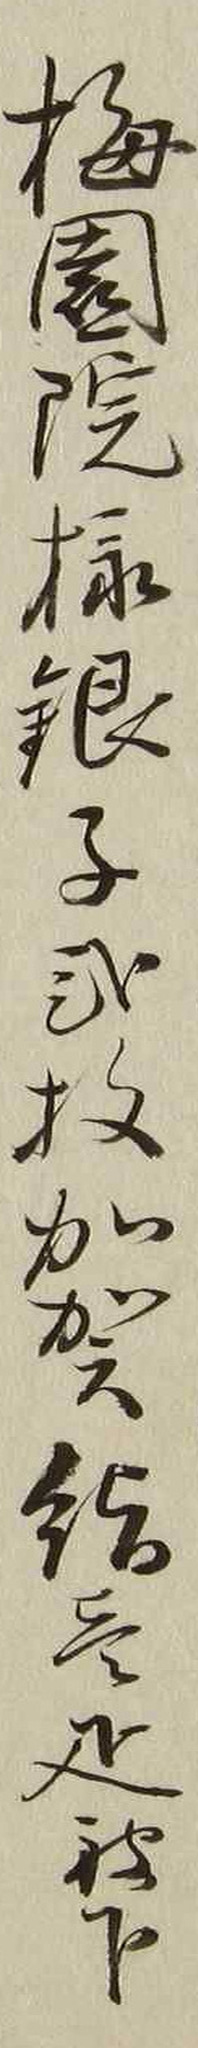梅園院様銀子二枚加賀絹壱疋被下
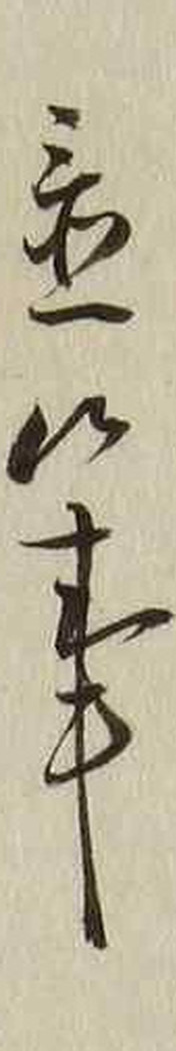置候事
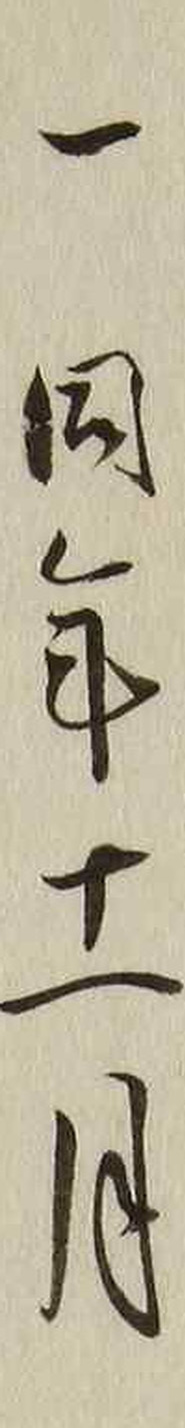一同年十一月
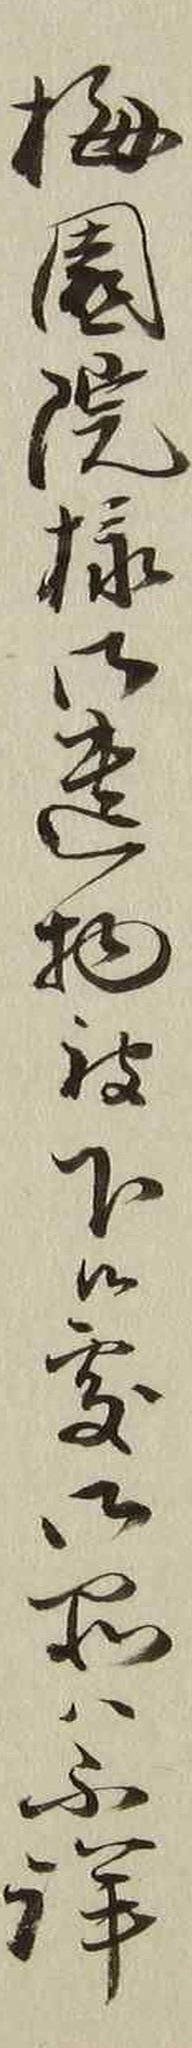梅園院様御遺物被下候処御品は不詳
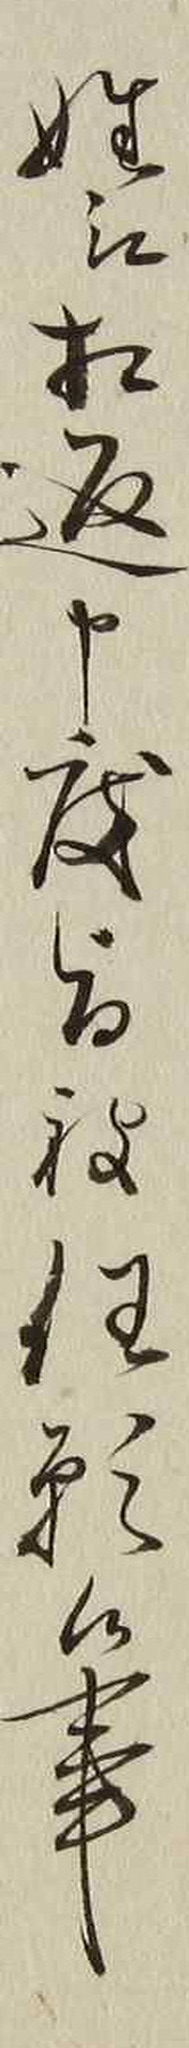姓え相返申度旨被任願候事
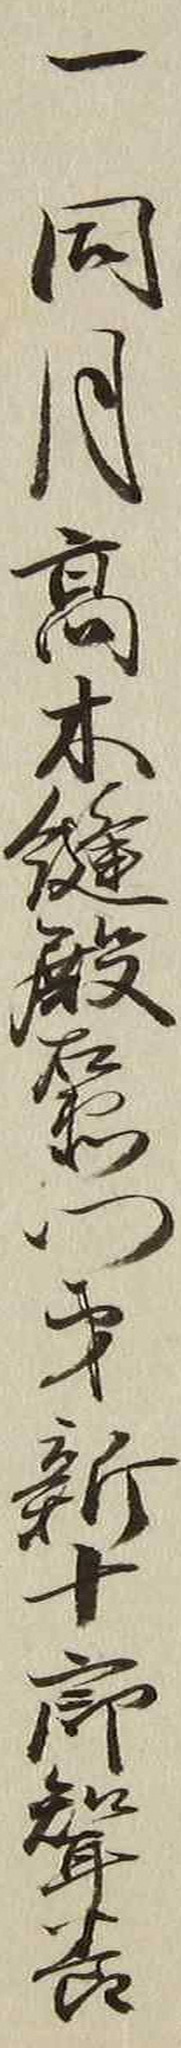一同月高木縫殿右衛門弟新十郎聟養
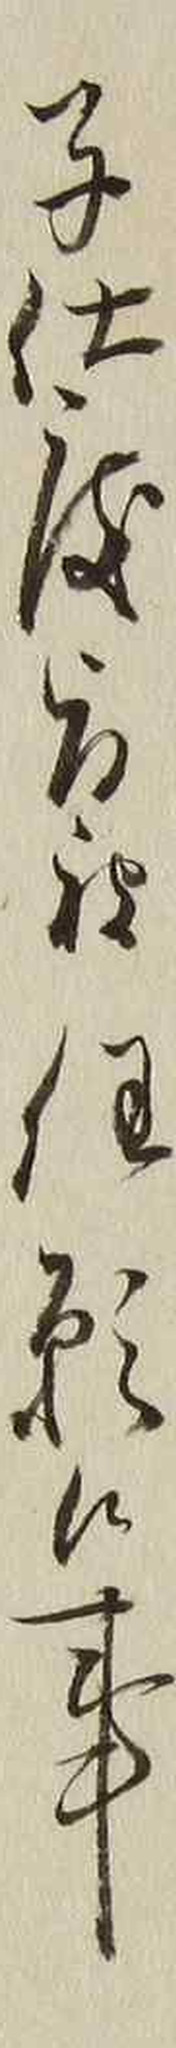子仕度旨被任願候事
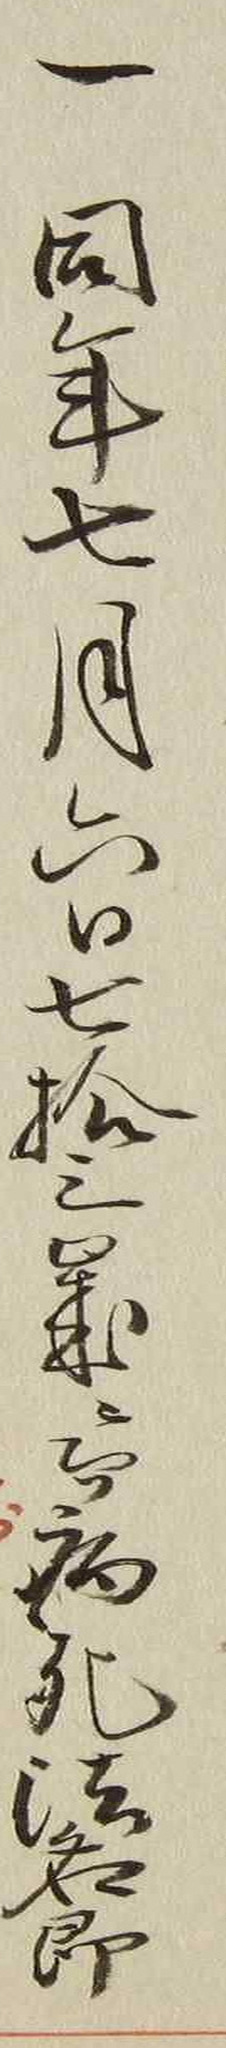一同年七月六日七拾三歳ニ而病死法名即
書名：諸士系譜　巻之163　な之部5
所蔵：会津若松市立会津図書館
